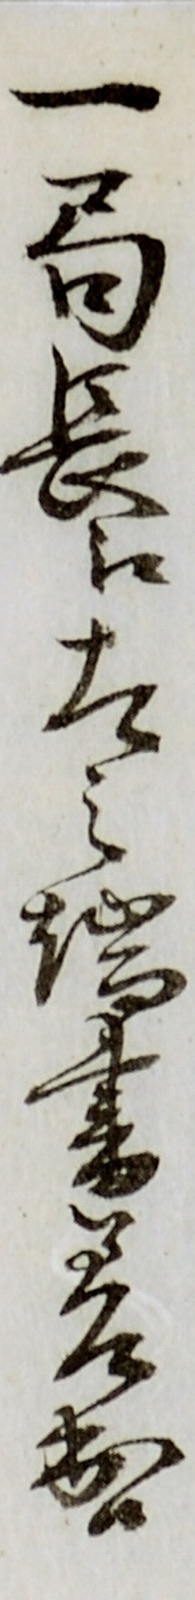一局長へ左之端書差出候
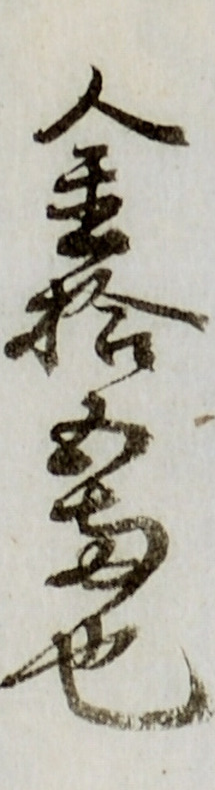金拾五両也
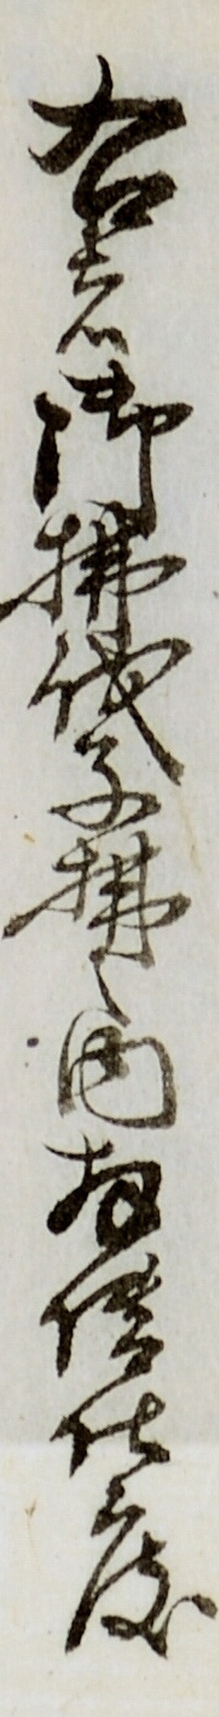右は御払伐子払之内拝借仕度
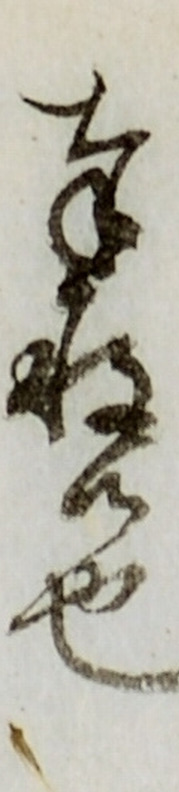奉存候也
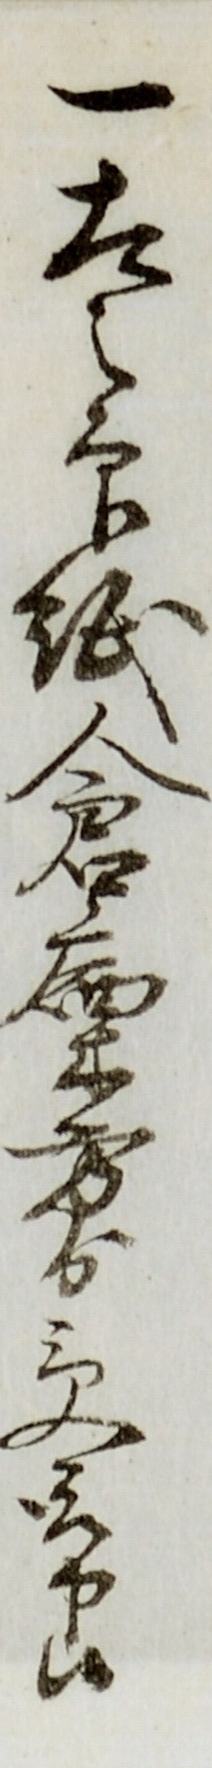一左之印紙倉廩方ゟ受取申候
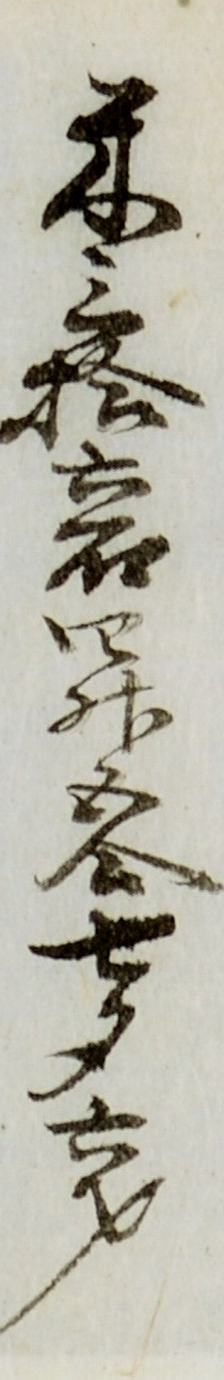米三拾六石四升五合七勺六才
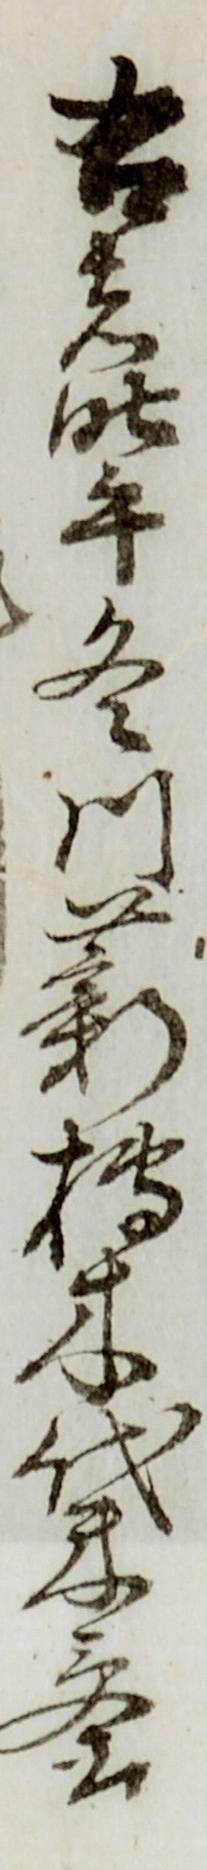右は昨午冬川薪榑木代米受取
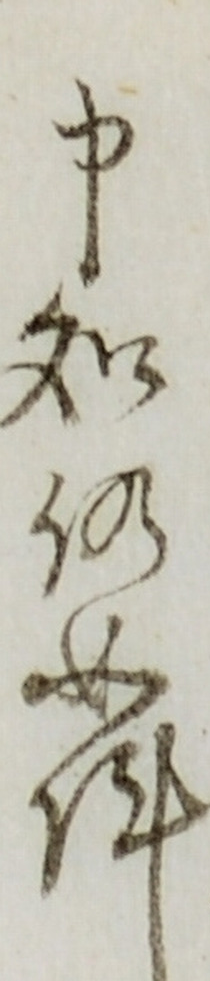申処仍如件
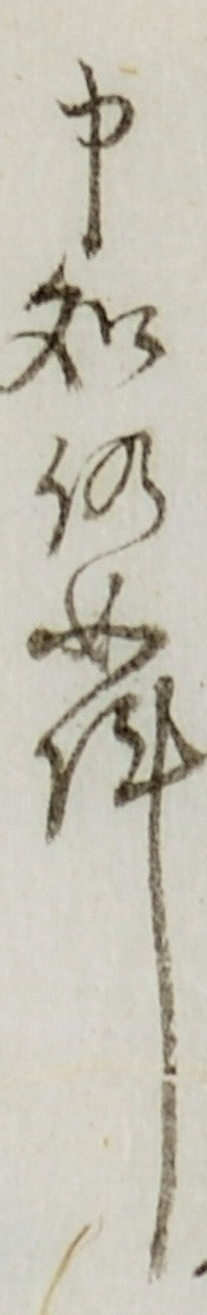申処仍如件
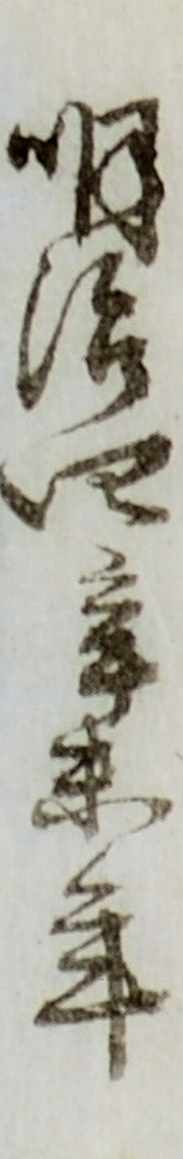明治四辛未年
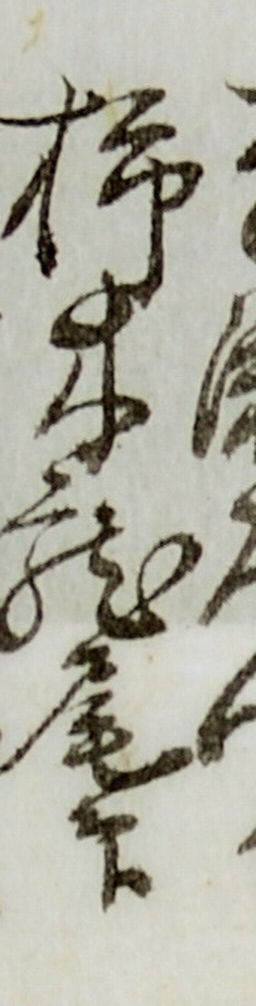柿木龍尾印
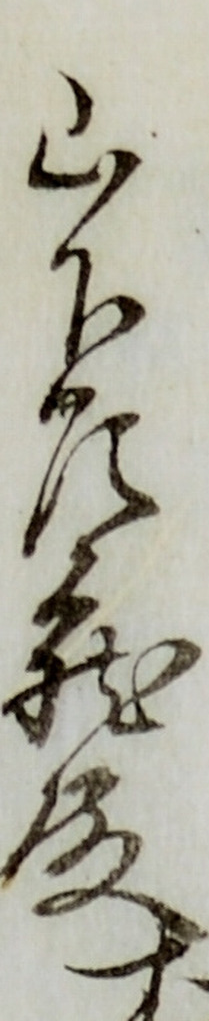山下左蔵殿
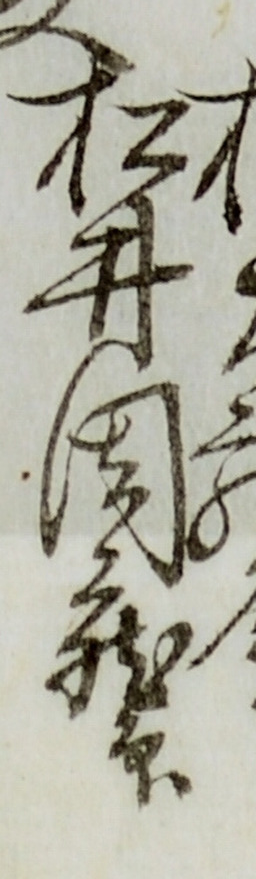松井周蔵印

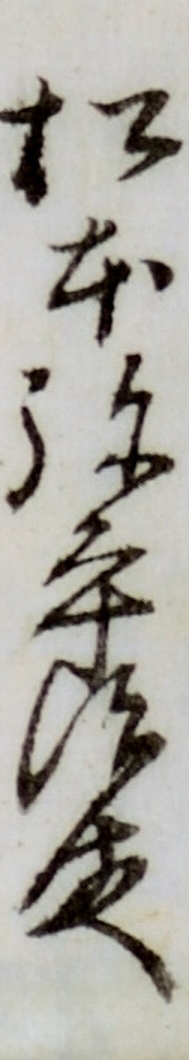松本弥平治殿
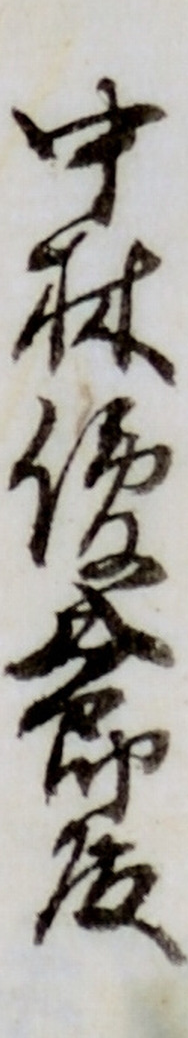中林俊五郎殿
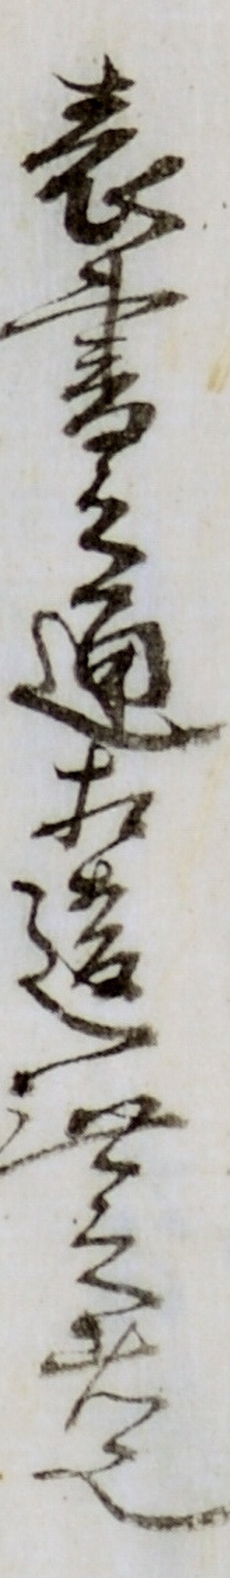表書之通相違無之者也
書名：山林方諸事御用留
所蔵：伊那市立高遠町図書館・合同会社AMANE
